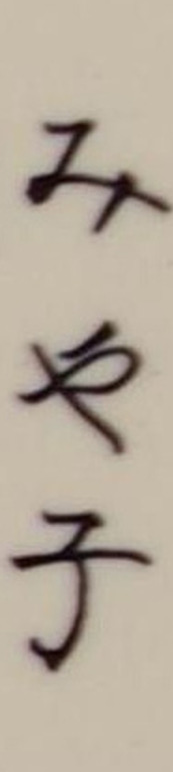みや子
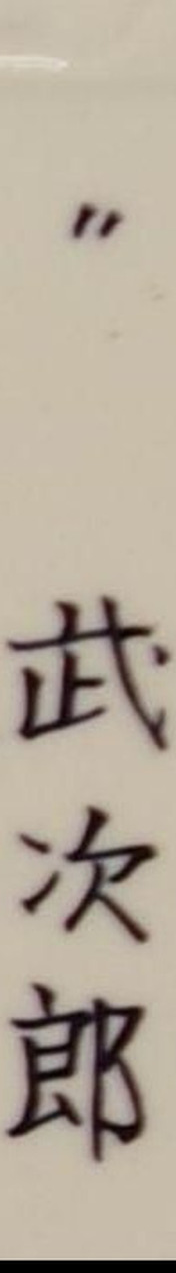武次郎
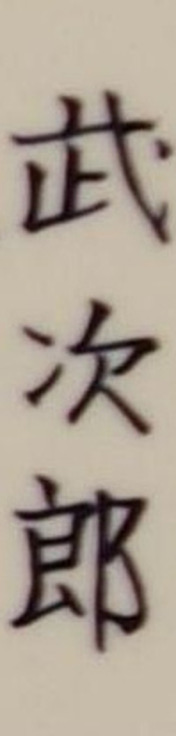武次郎
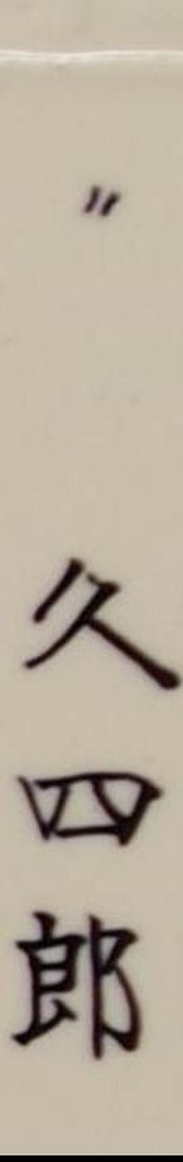久四郎
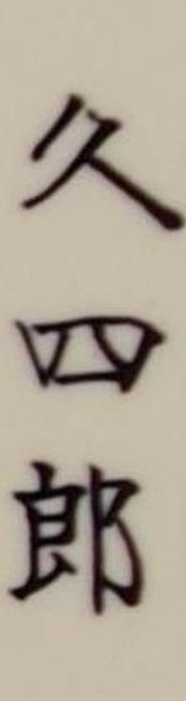久四郎
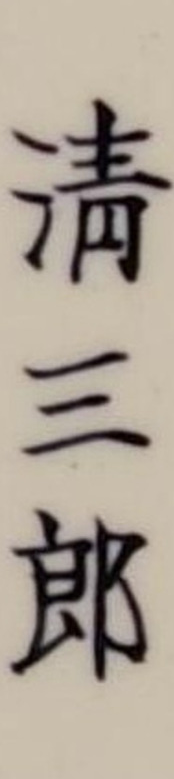清三郎
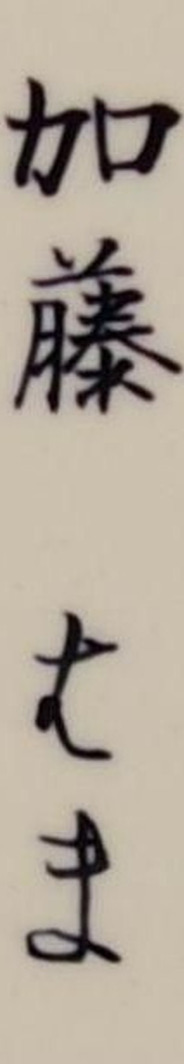加藤はま
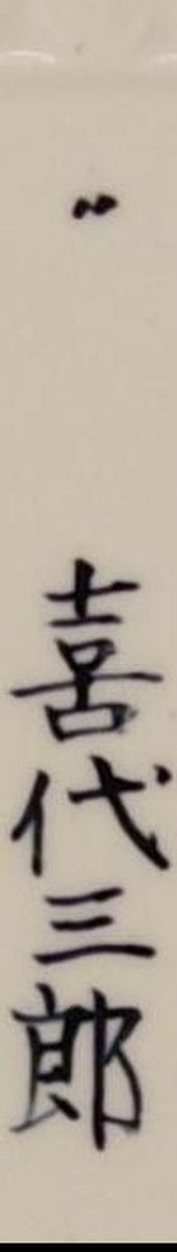喜代三郎
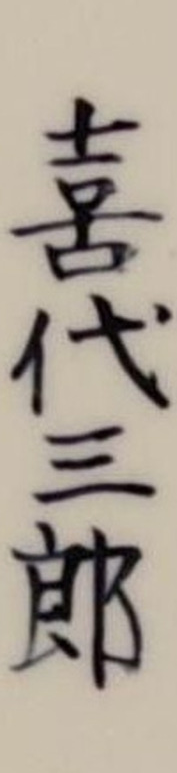喜代三郎
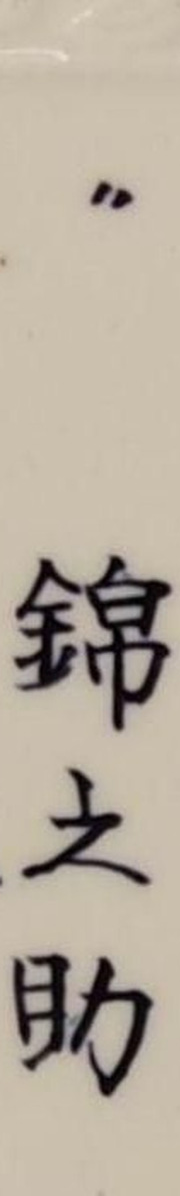錦之助
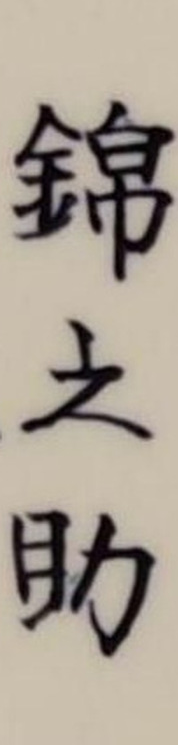錦之助

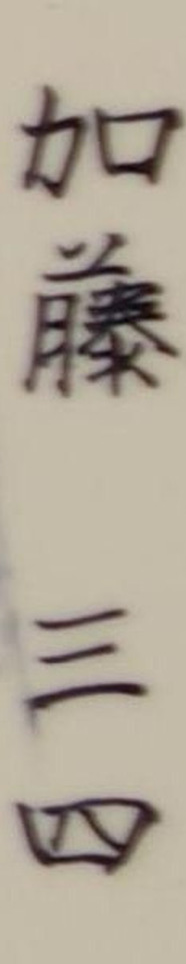加藤三四
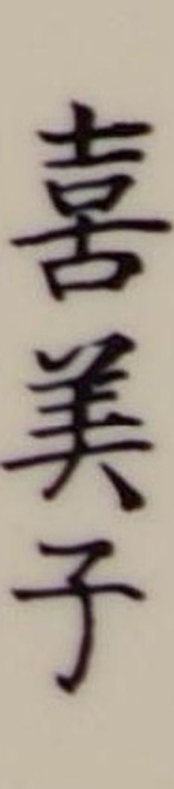喜美子
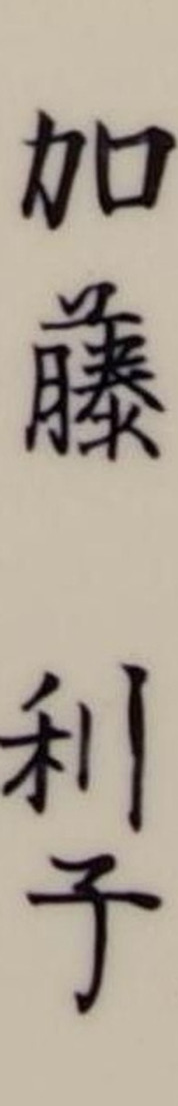加藤利子
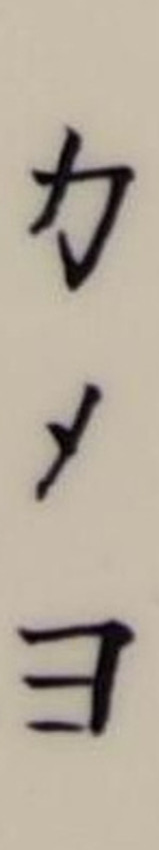カメヨ

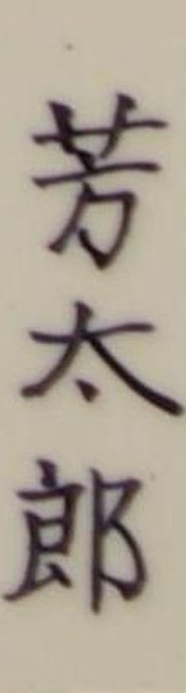芳太郎
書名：M~S
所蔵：高野山金剛峯寺
